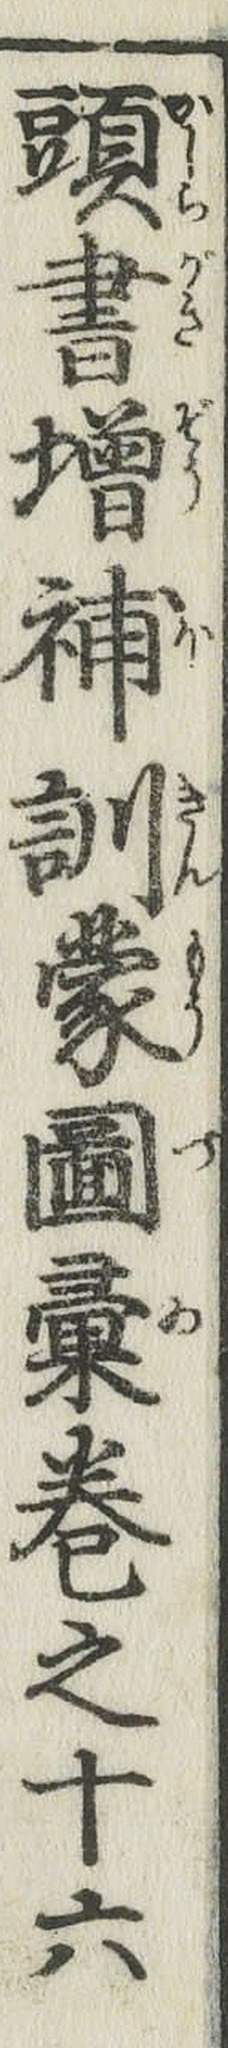頭書増補訓蒙図彙巻之十六
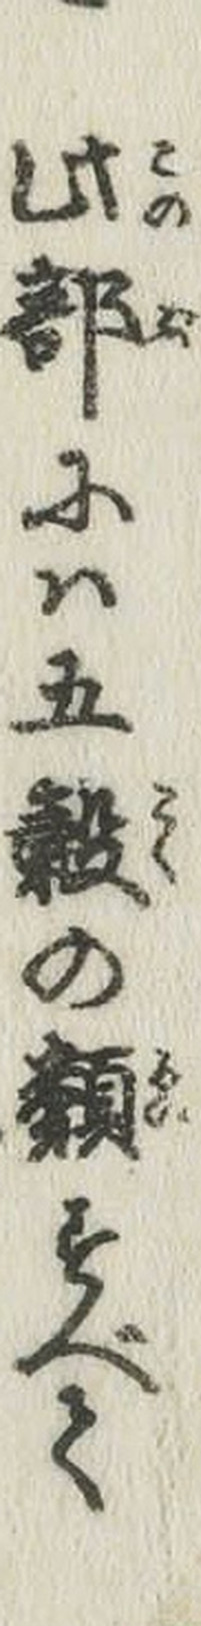此部には五穀の類すべて
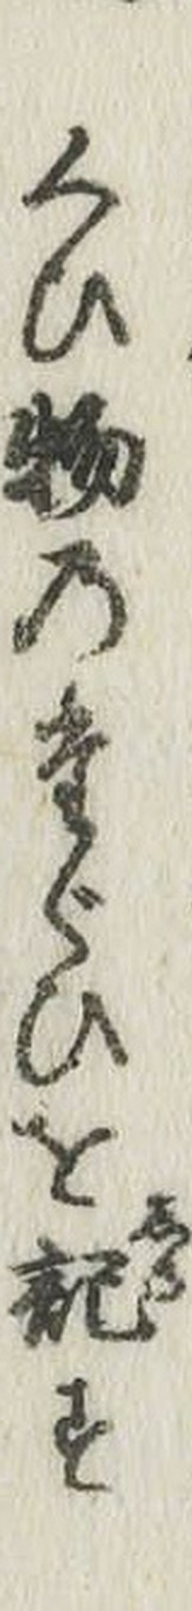くひ物のたぐひをしるす
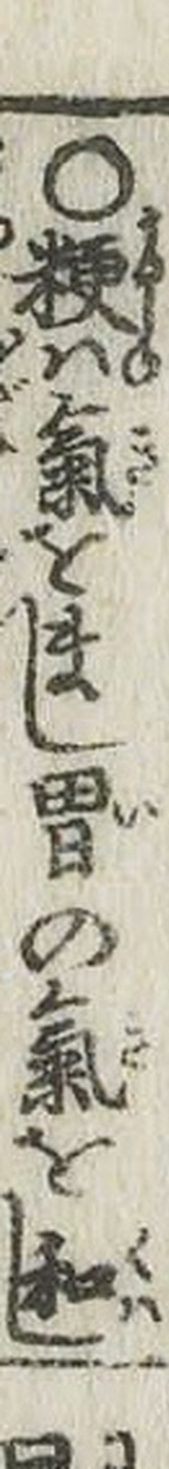○粳は気をまし胃の気を和し
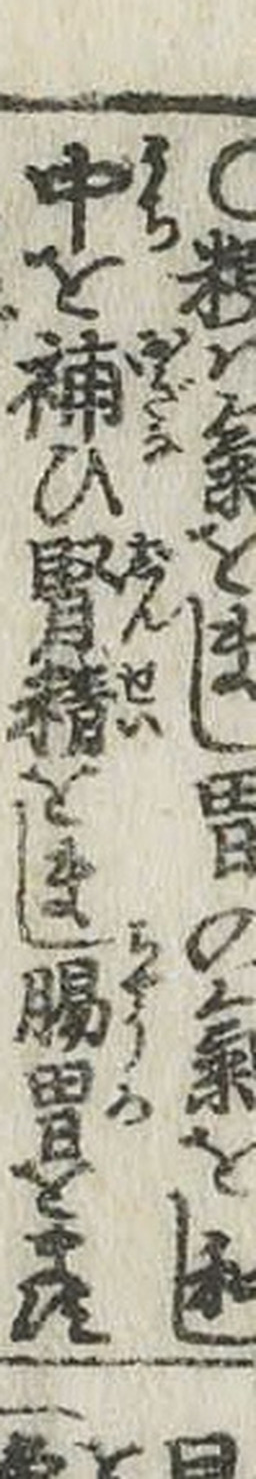中を補ひ腎精をまし腸胃をます
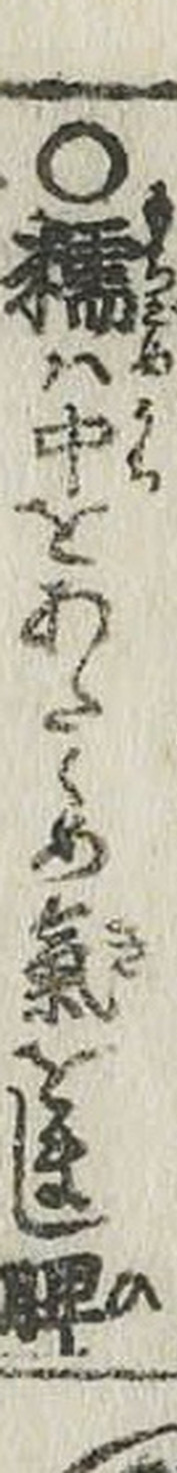○糯は中をあたゝめ気をまし脾
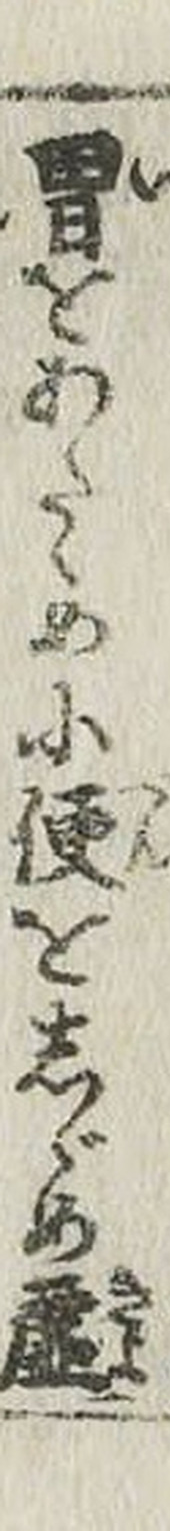胃をあたゝめ小便をしゞめ虚
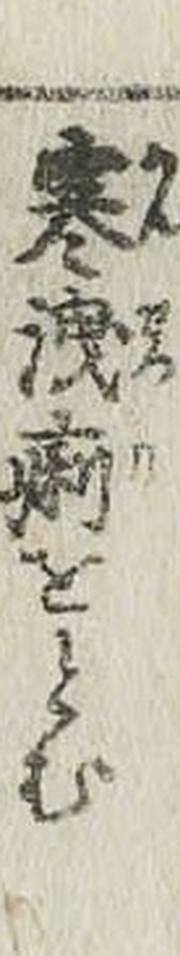寒洩痢をとむ
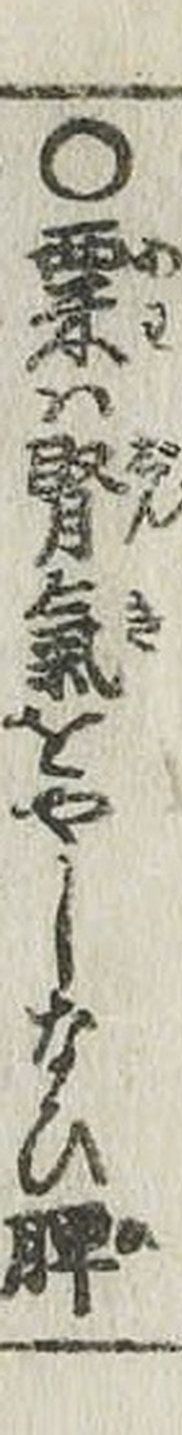○粟は腎気をやしなひ脾
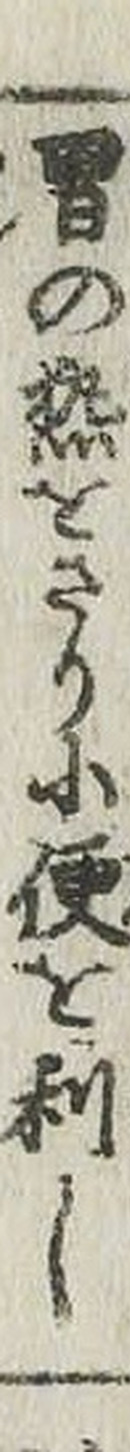胃の熱をさり小便を利し
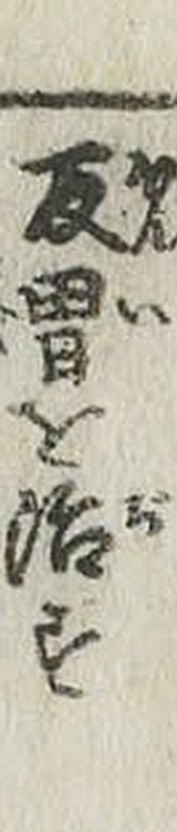反胃を治す
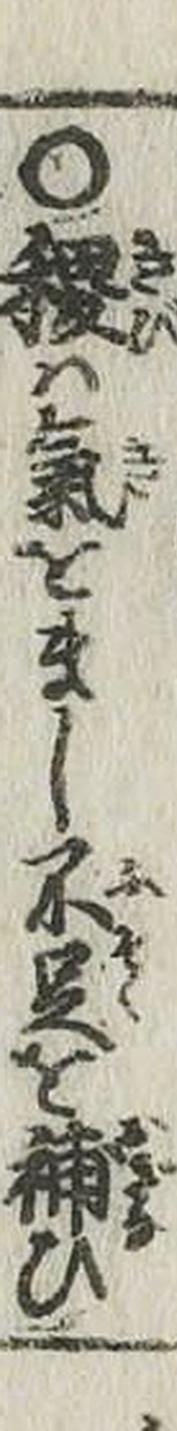○稷は気をまし不足を補ひ
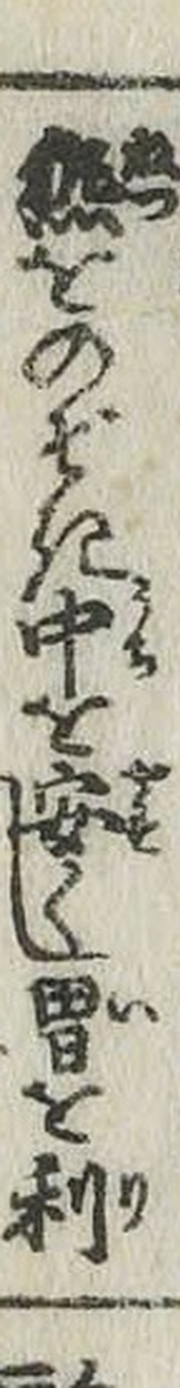熱をのぞき中を安くし胃を利
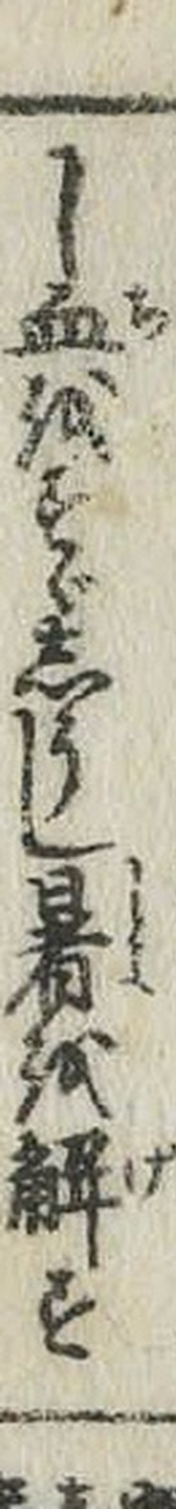し血をすゞしうし暑を解す
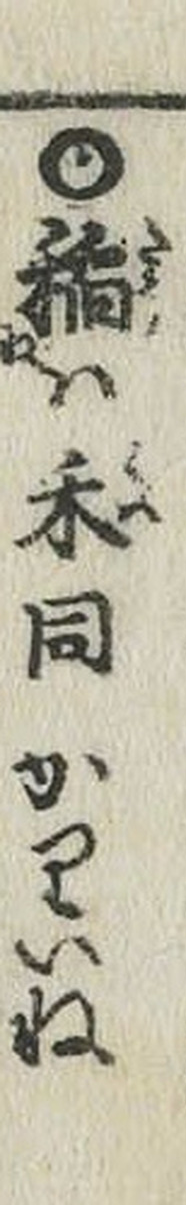○稲は禾同かりいね

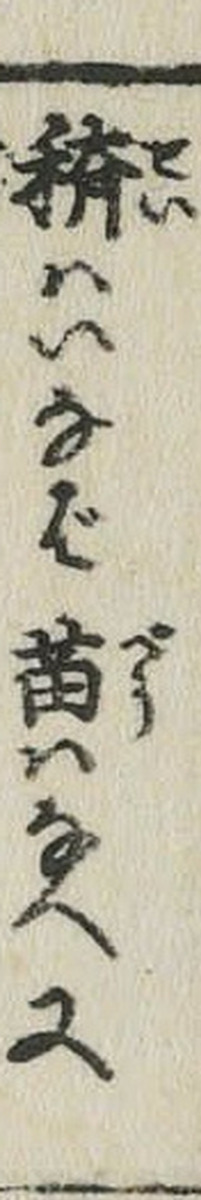穧はいなば苗はなへ又
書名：増補頭書訓蒙図彙大成 10巻 7:巻之14-16
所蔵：東京学芸大学教育コンテンツアーカイブ
